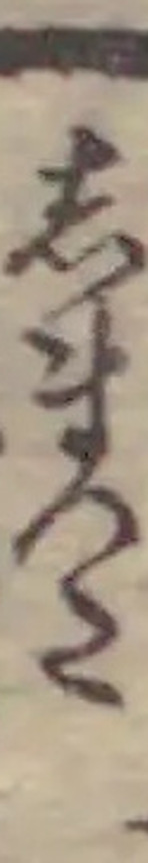しまつた

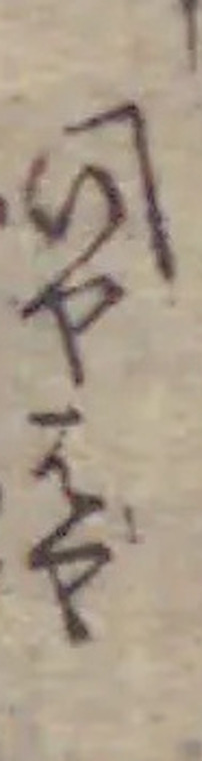〽いやはや
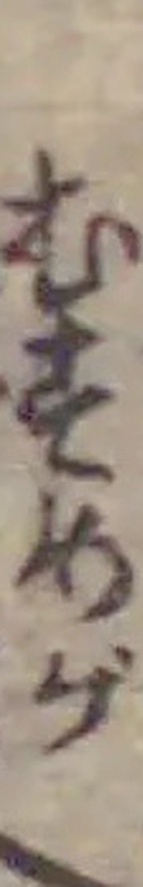むすめが
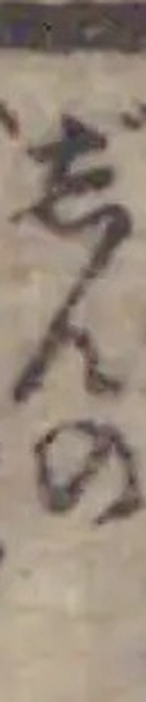じんの
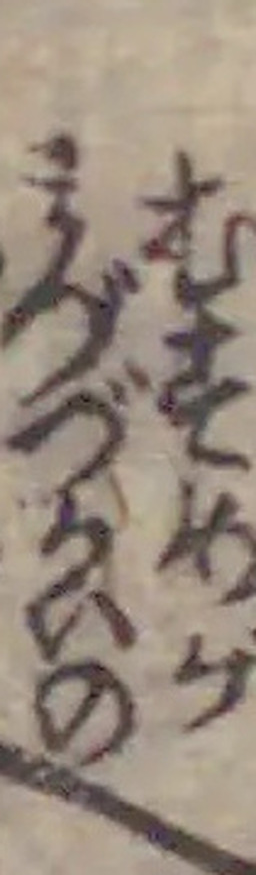みづづかいの
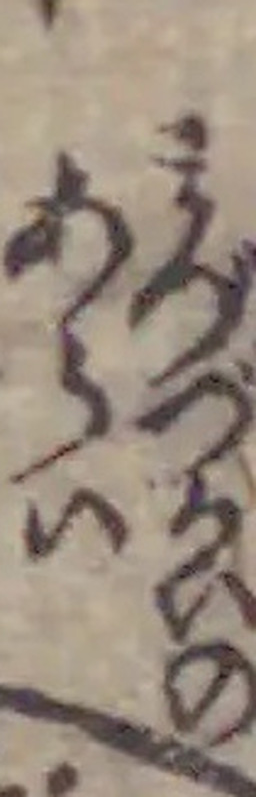あらい
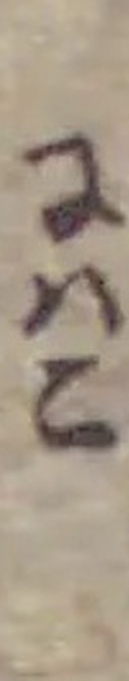にはこ
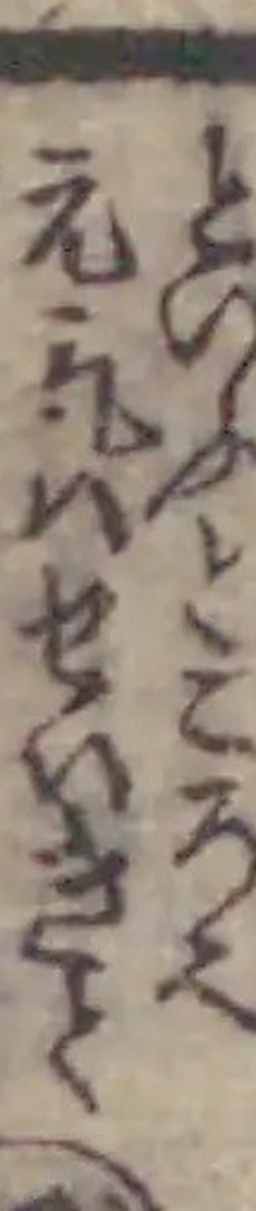元気はせいきと
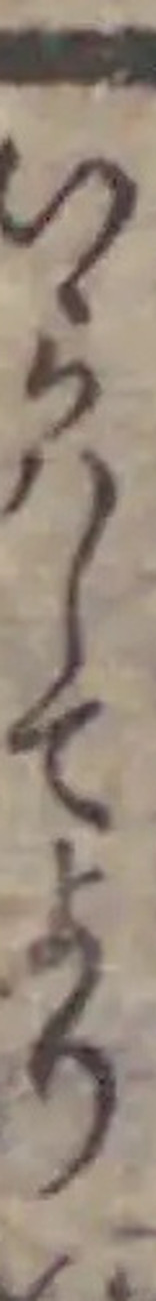いゝかはしてより
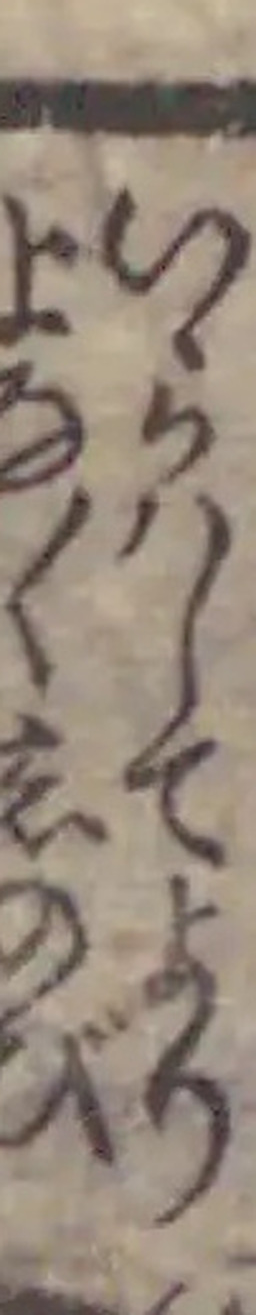よな〳〵しのび
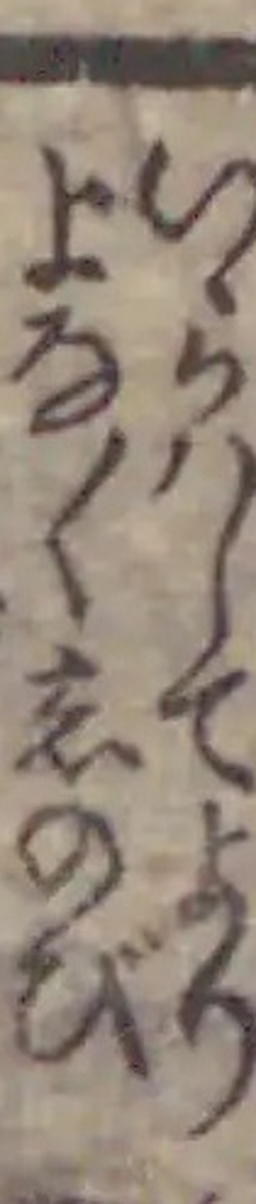よな〳〵しのび
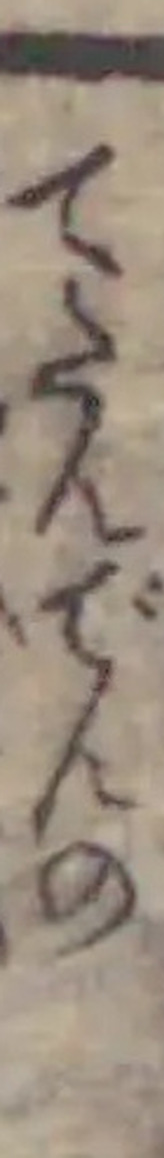てたんでんの
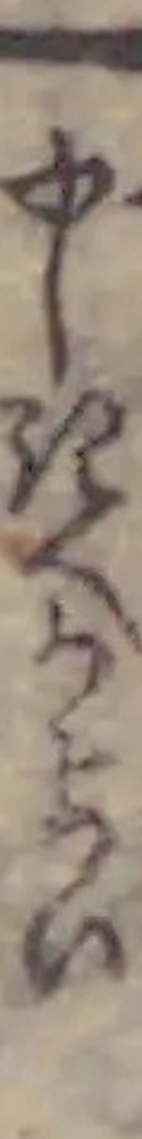やしきへかよい
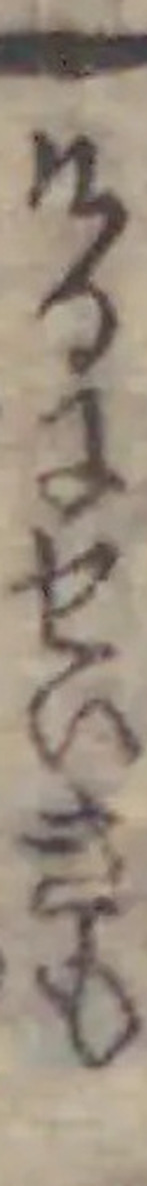けるにせいきも
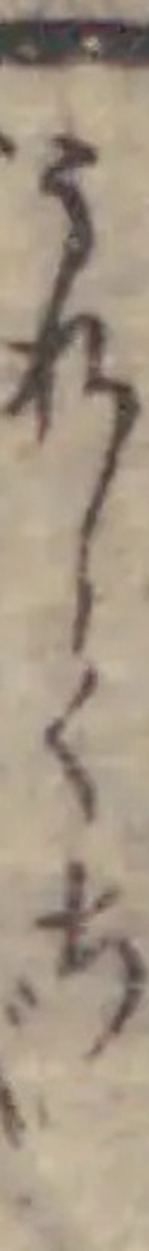うれしくち
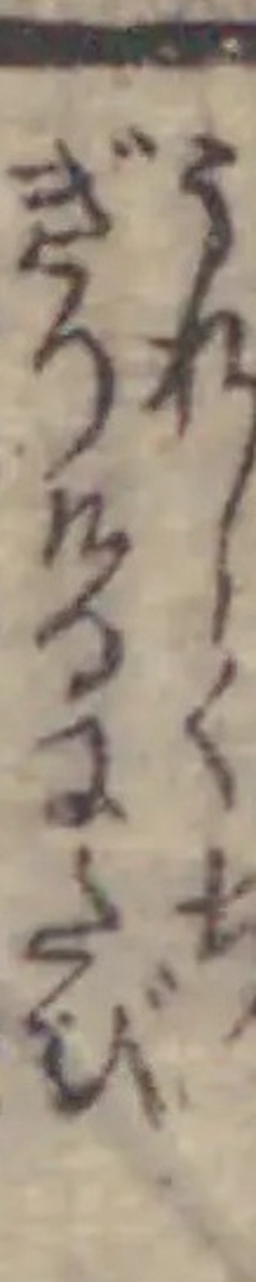ぎりけるにたび
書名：腹内養生主論 3巻
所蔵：国立国会図書館 National Diet Library, JAPAN
